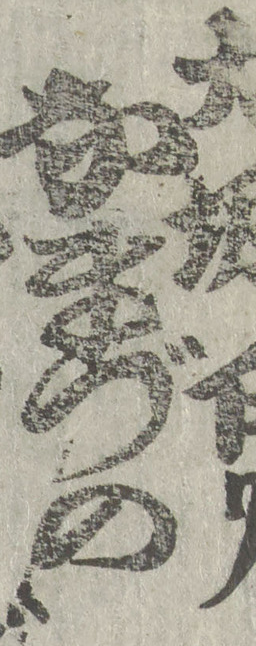なまづの
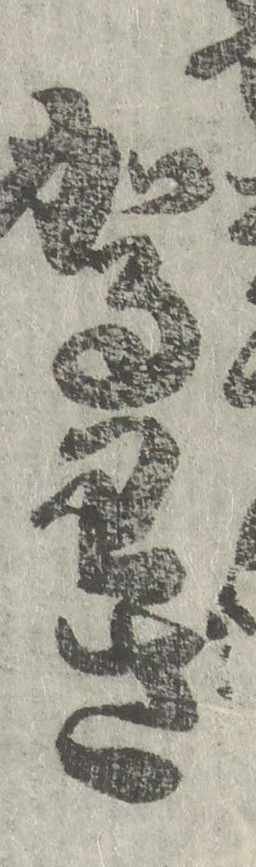かるわざ
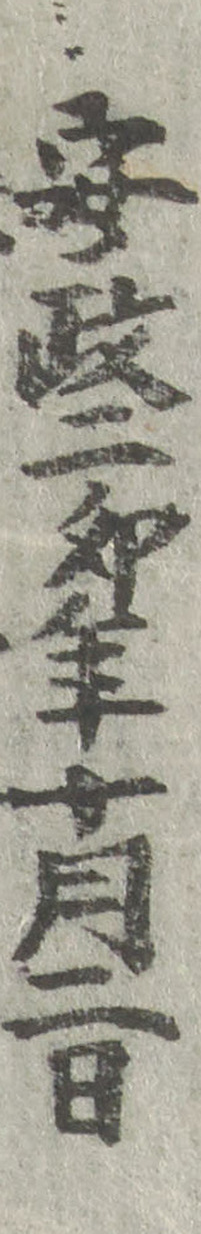安政二卯年十月二日
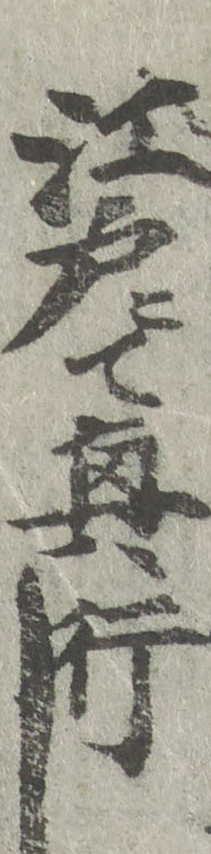江戸にて興行
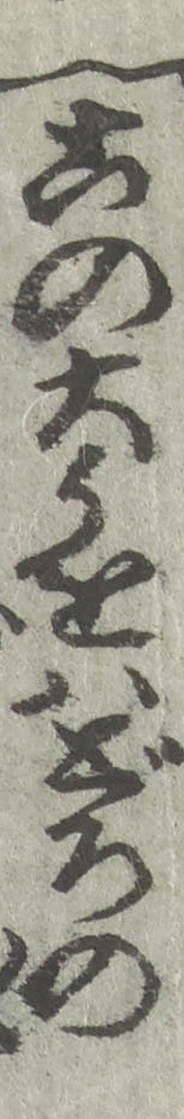｢この大かをはどろの
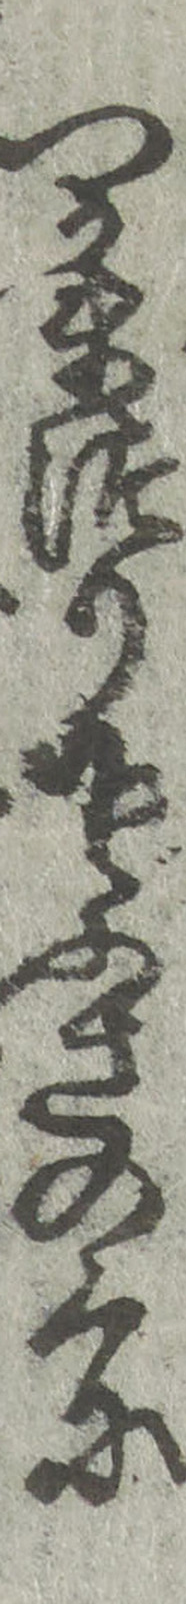つかまつり下ふさのくに
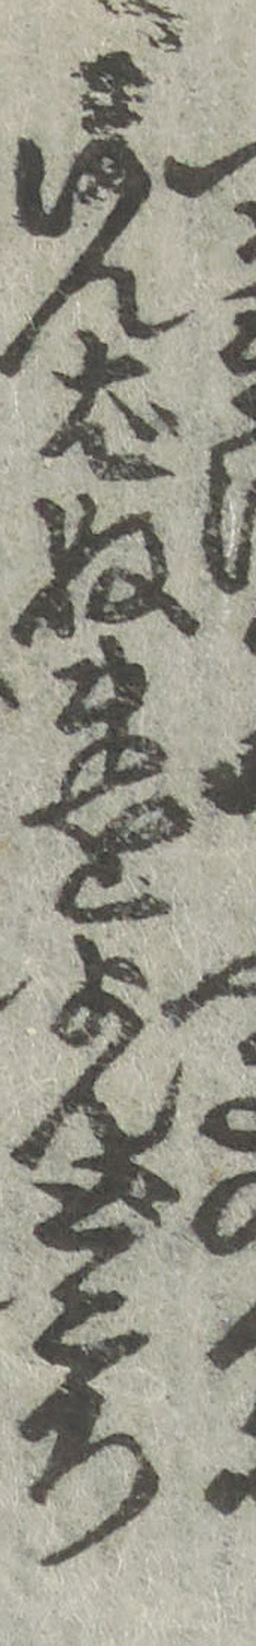いんばぬまをよんどころ
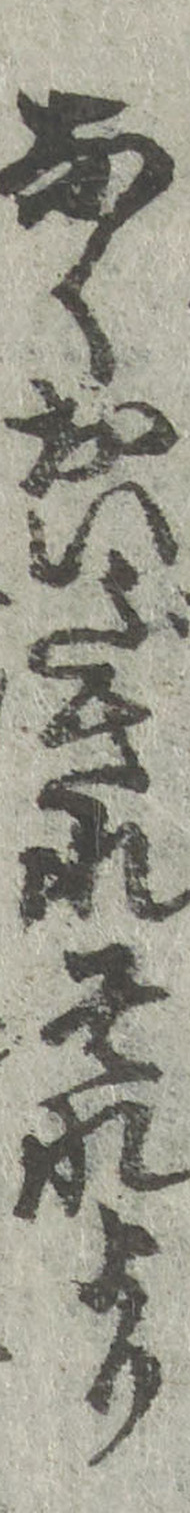なくおいだされそれより
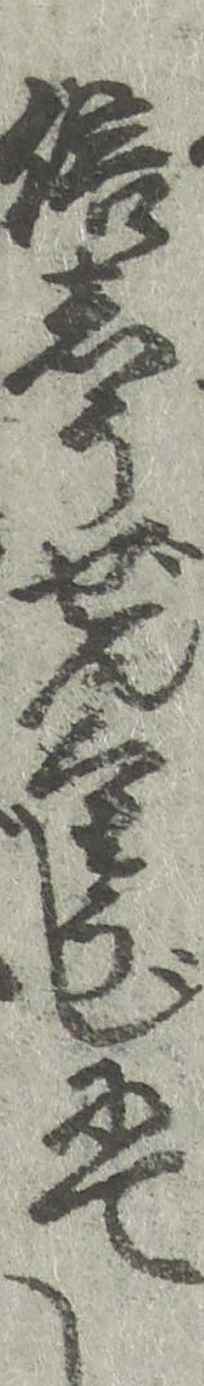信しうぜんくわうじにて
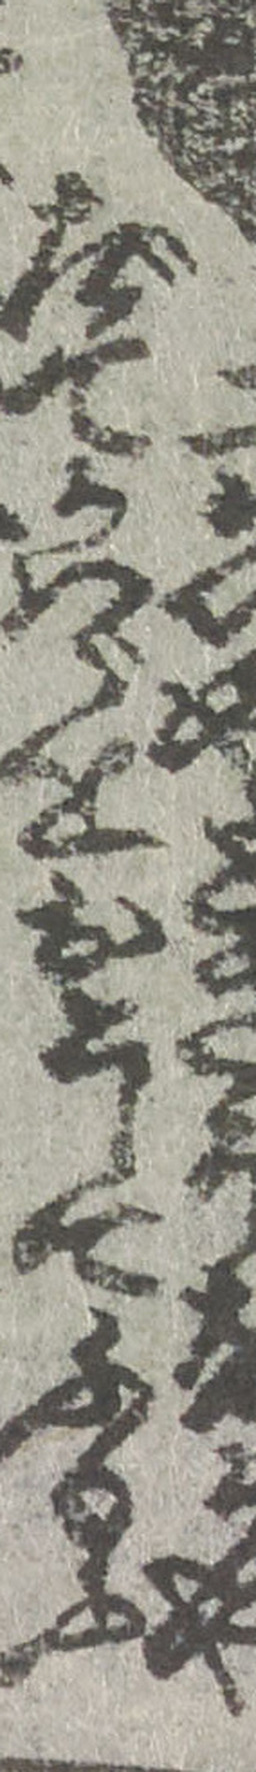だてかはらをおとしてふるふ
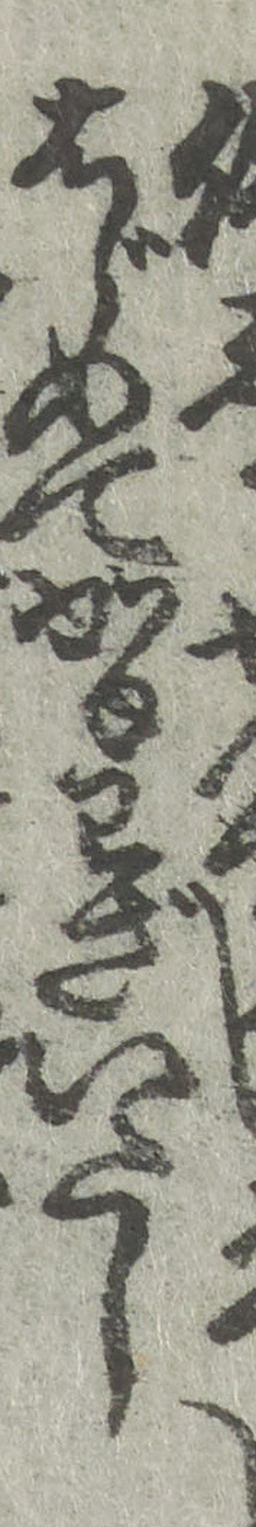はじめてかるわざいたし
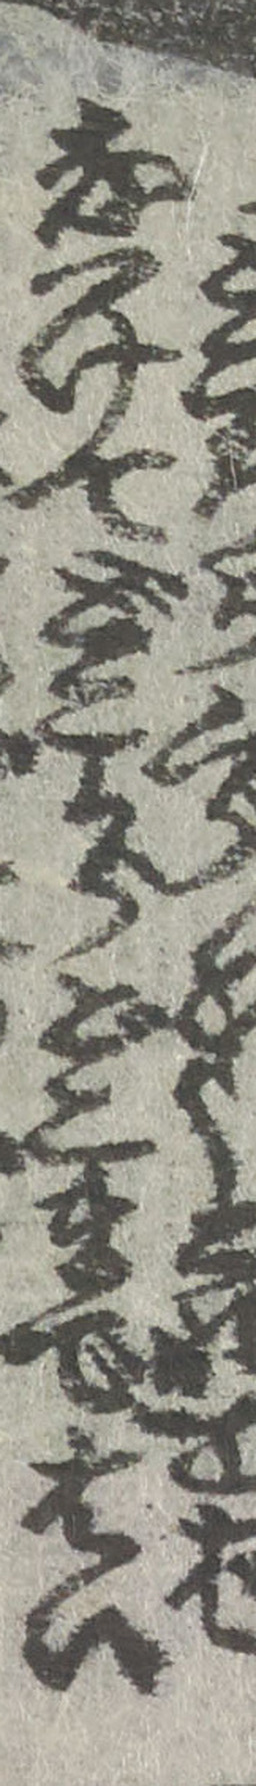なつけてどこからどこまではい
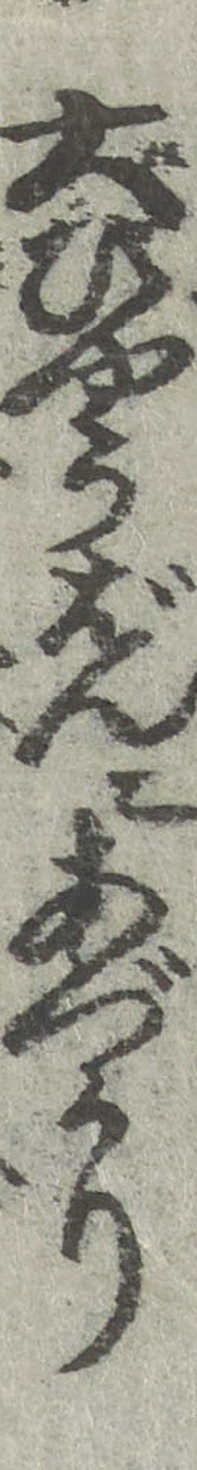大ひやうばんにあづかり
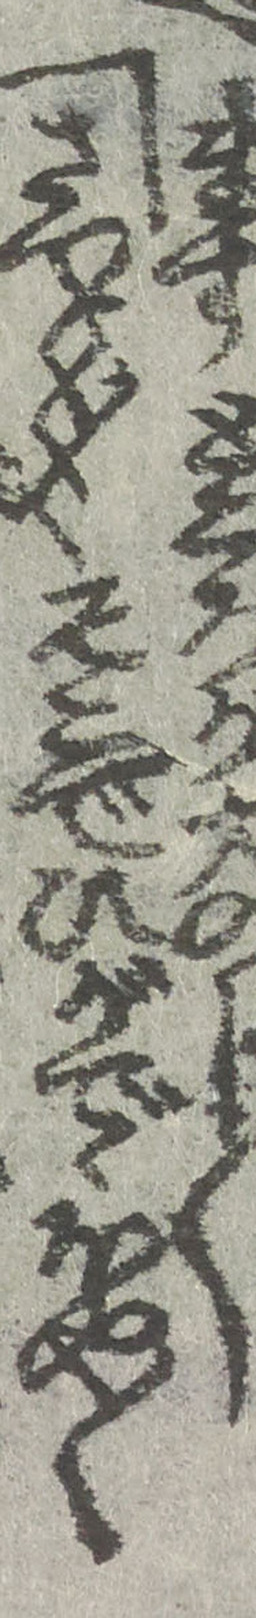｢さて〳〵〳〵〳〵そこでひがでゝほや〳〵
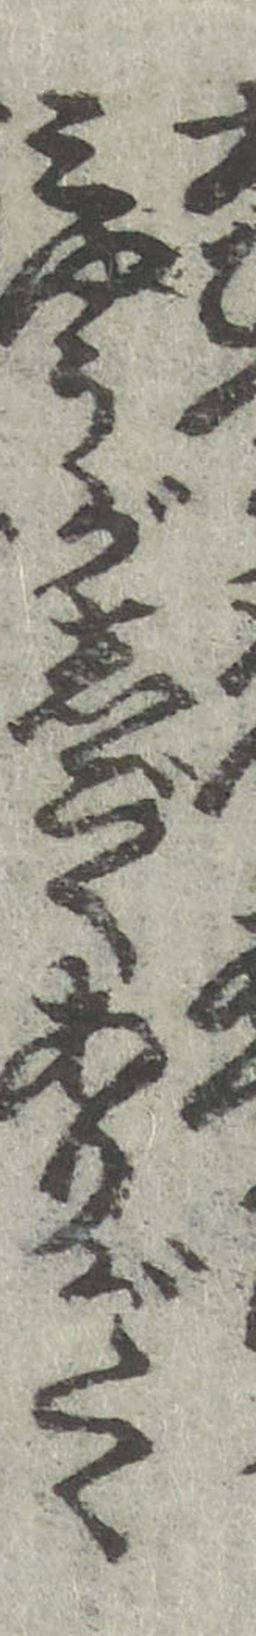みやうがしごくありがたく
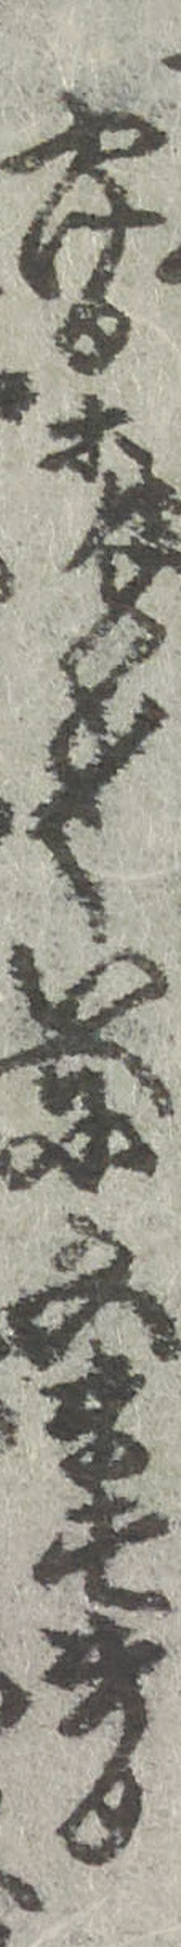やけるホイ〳〵〳〵〳〵いへにかいますまる
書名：大坂下りなまづのかるわざ
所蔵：東京大学総合図書館 General Library in the University of Tokyo, JAPAN
